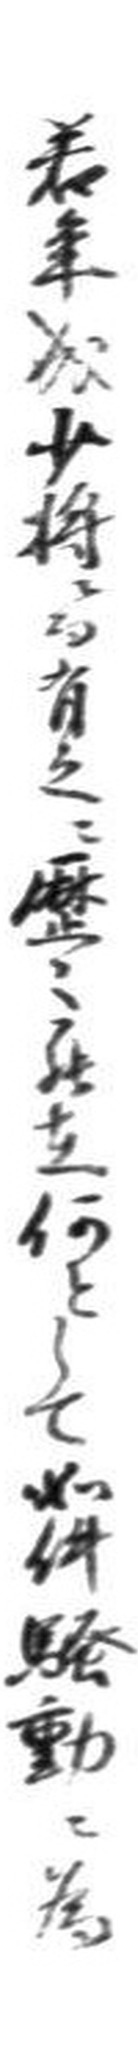若年成少将ニ而有之ニ歴々罷在何として如件騒動ニ為
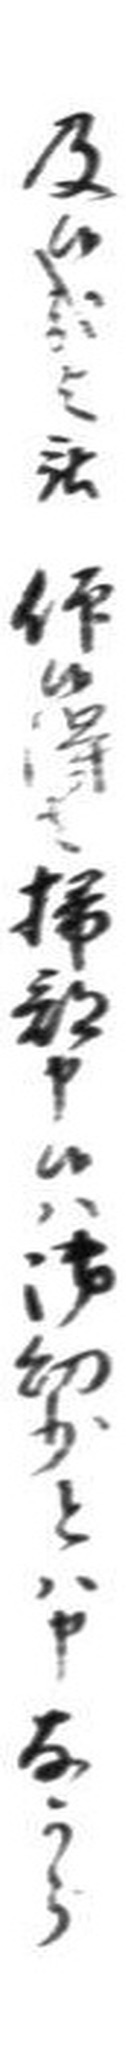及候哉与被仰候得者掃部申候ハ御幼少とハ申なから

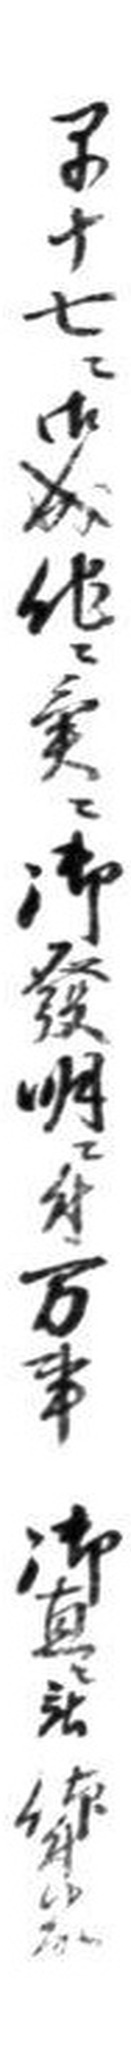早十七ニ御成他ニ実ニ御発明ニ付万事御直ニ被仰付候故
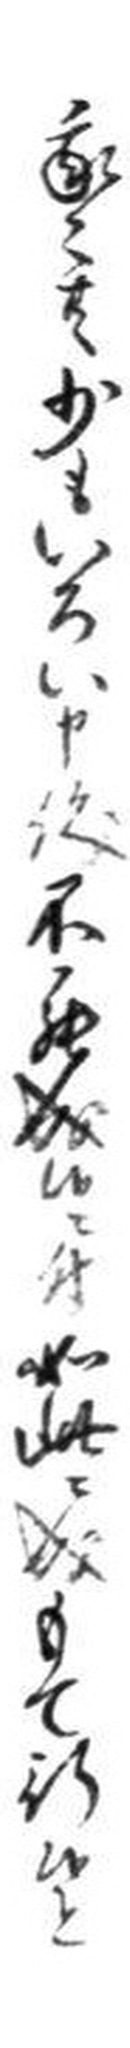我々共少もいろい申儀不罷成候ニ付如此ニ成もて行候と
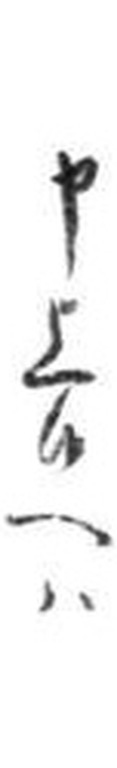申上候ヘハ
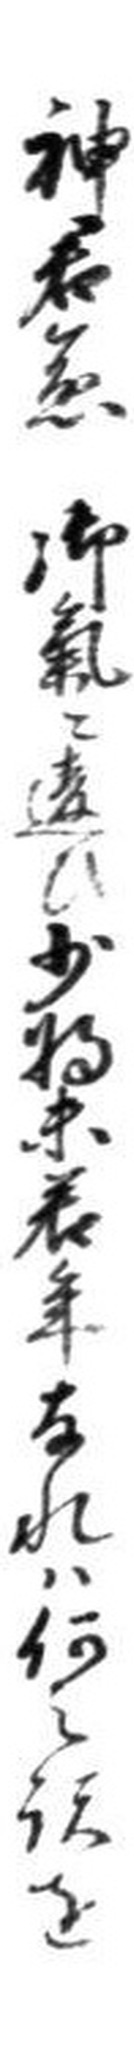神君愈御気ニ違ひ少将未若年なれハ何之訳を
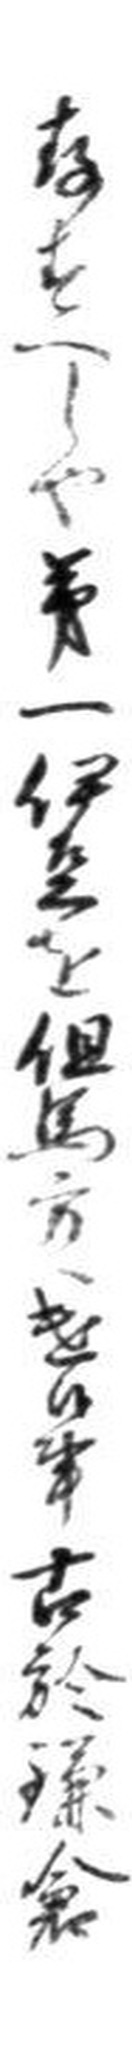存すへしや第一伊豆を但馬方へ遣候事古於鎌倉
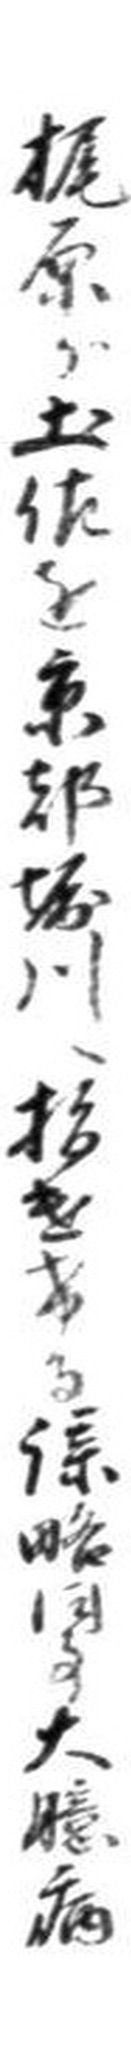梶原が土佐を京都堀川へ指遣ける謀略同事大臆病
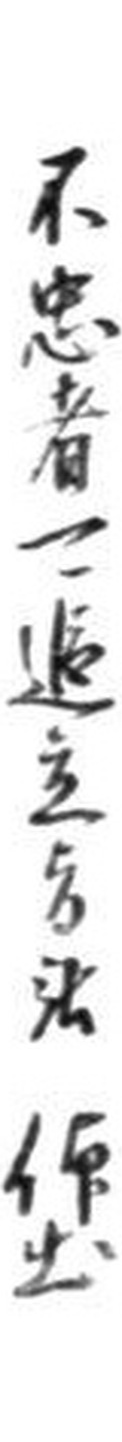不忠者可追立旨被仰出
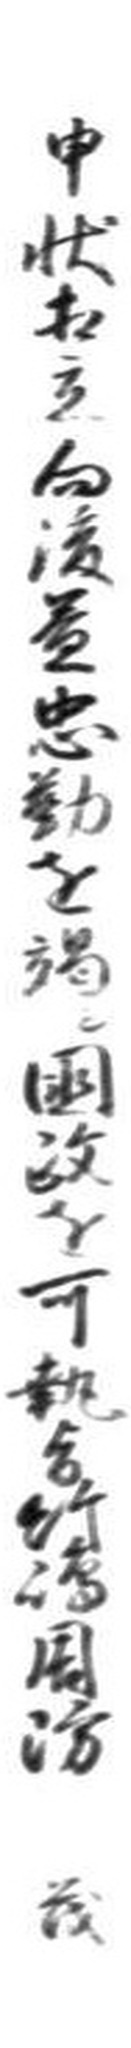申状相立向後益忠勤を竭シ国政を可執旨竹嶋周防茂
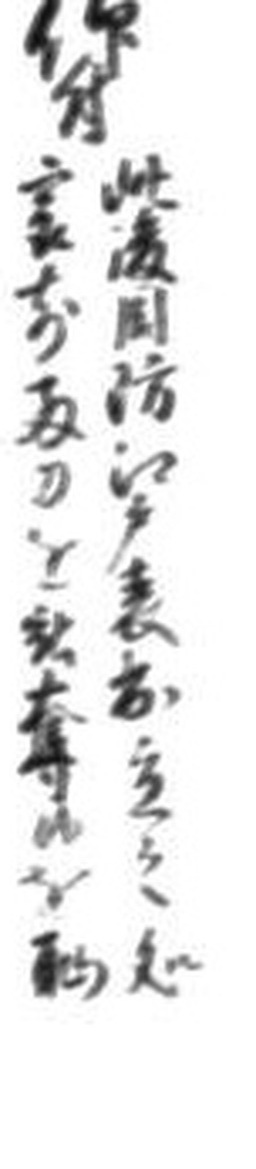最前両刀を被奪候を恥
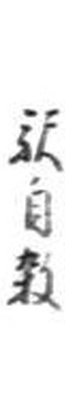駅自殺
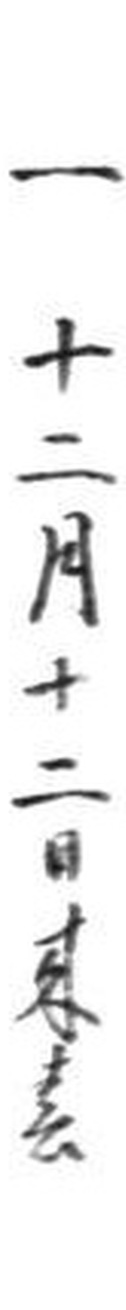一十二月十二日来春
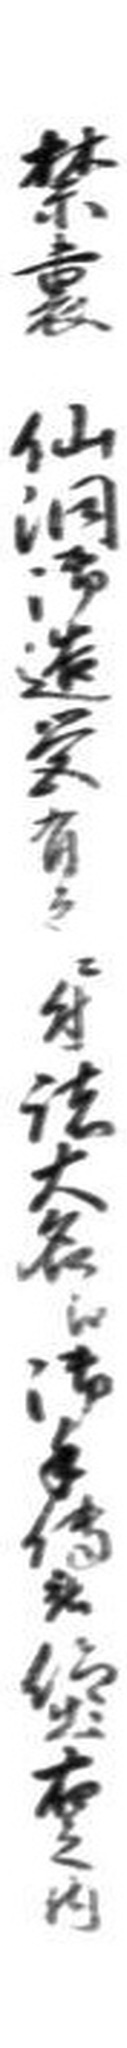禁裏仙洞御造営有之ニ付諸大名江於手伝被仰出右之内
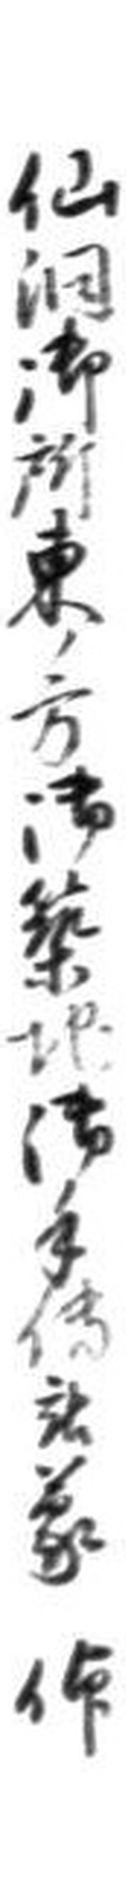仙洞御所東ノ方御築地御手伝被蒙仰
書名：家譜 二 忠直公 従文禄四年到慶安四年
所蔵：福井県文書館 Fukui Prefectural Archives
